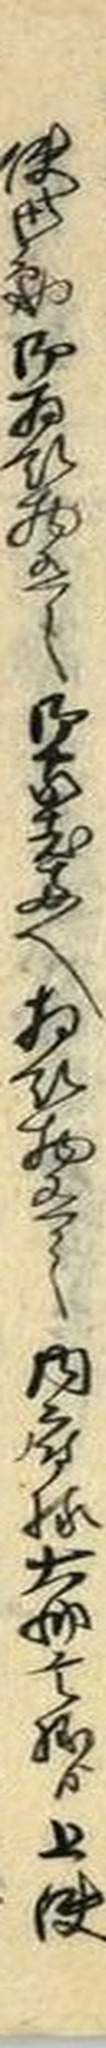使御勤御拝領物有之御家老両人拝領物有之内府様大納言様ゟ上使
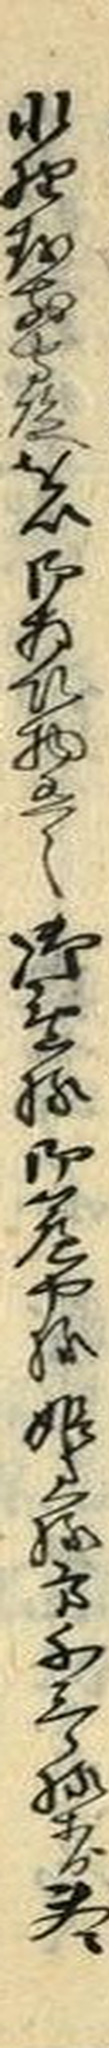水野越前守殿を以御拝領物有之御台様御簾中様姫君様方千三郎様等ゟ夫々
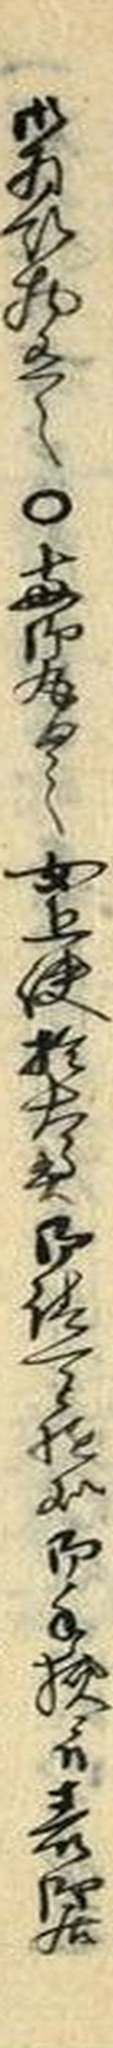御拝領物有之○両御丸ゟ之女上使於大奥御請可被遊候処御手狭ニ付表御居
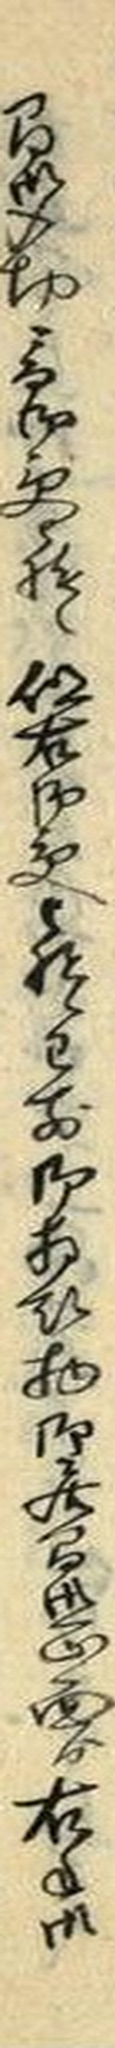間御〆切ニ而御受被遊候但右御受被遊候已前御拝領物御居間正面ゟ右手御
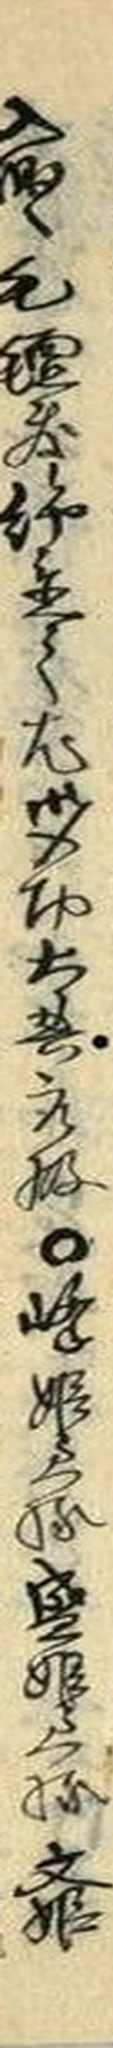入側へ毛氈敷飾置之尤御〆切大奥取扱○峯姫君様盛姫君様文姫
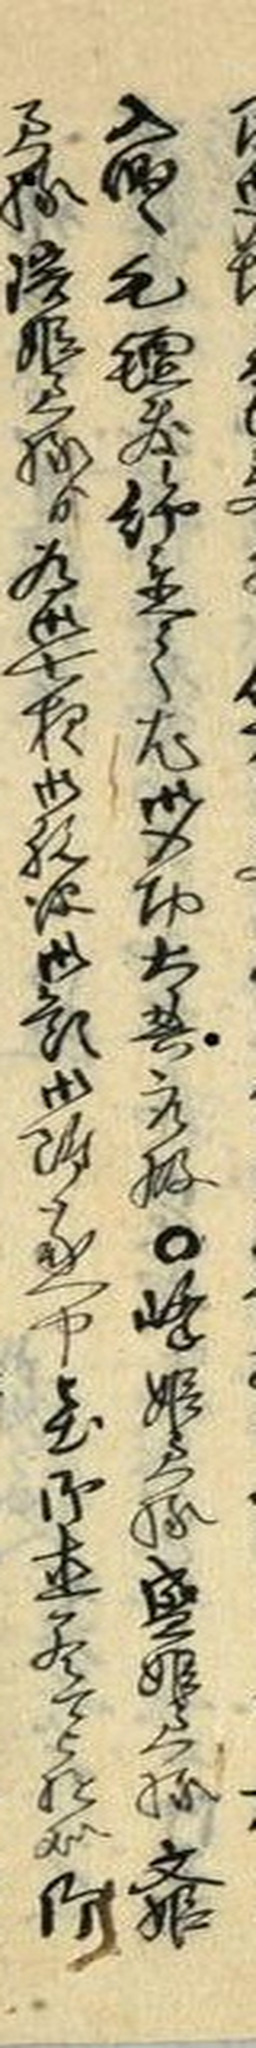君様溶姫君様ゟ為御七夜御祝儀御歓御附御用人中被出御直答可被遊候処御
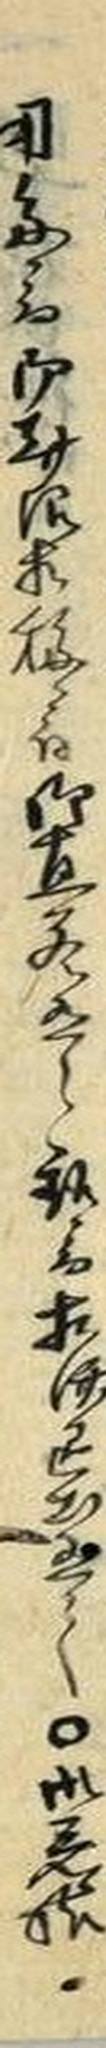用多ニ而御刻限相移候ニ付御直答有之趣ニ而相済退出有之○御若様
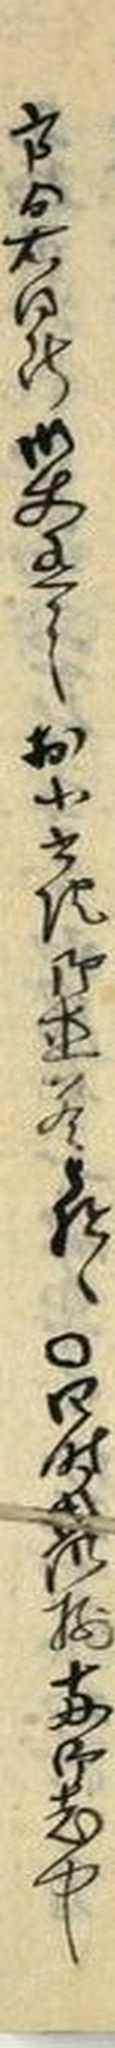方ゟ右同断御使有之於小書院御直答被遊候○四時御供揃両御老中

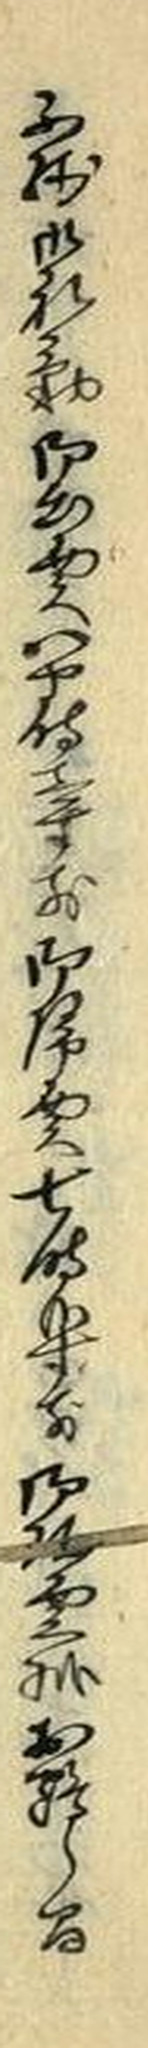不残御礼勤御出殿八半時壱寸前御帰殿七時弐寸前御帰殿掛於鶴之間
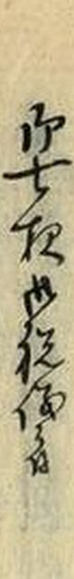御七夜御祝儀ニ付
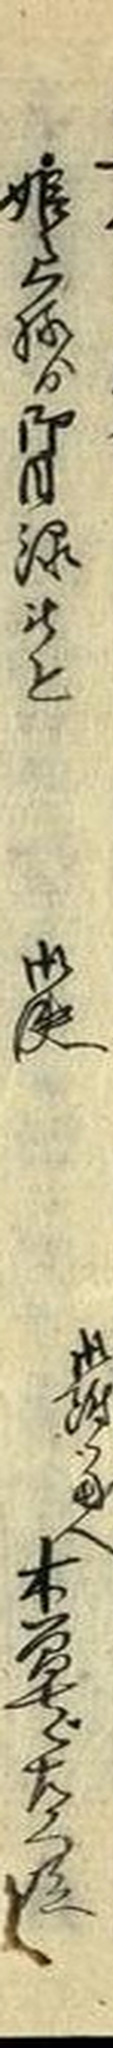姫君様ゟ御目録被進御使御附御用人木曽七郎左衛門殿
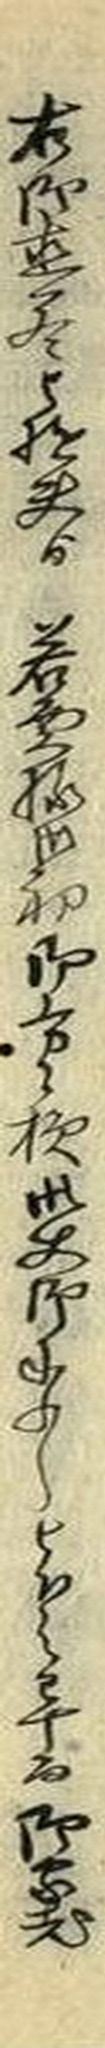右御直答被遊夫ゟ若殿様御初御方々様御使御手のし被下之畢而御家老
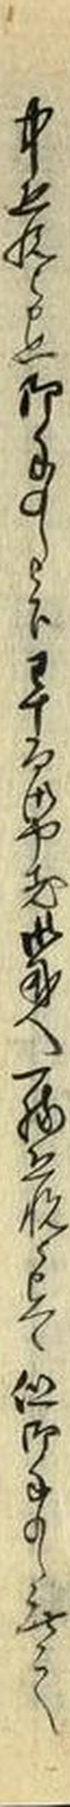中恐悦被申上御手のし被下畢而御中老御用人一統恐悦被申上候但御手のし無之
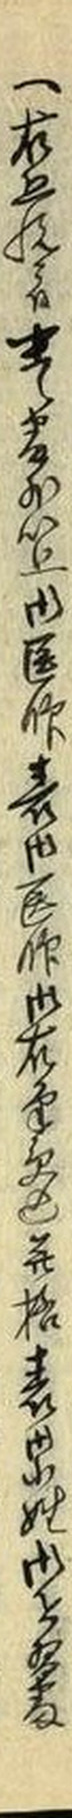一右恐悦ニ付未之番外以上御医師表御医師御右筆受込并格表御小姓御近習番
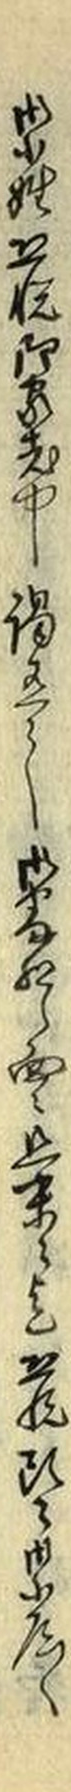御小姓恐悦御家老中謁有之御番組之面々且未々迄恐悦頭々御小屋へ
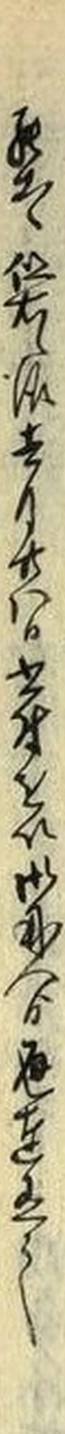罷出候但右之趣去月廿八日書付を以御用人ゟ通達有之
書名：少傅日録抄（斉承付側向頭取日記、在府）
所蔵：福井県文書館 Fukui Prefectural Archives
